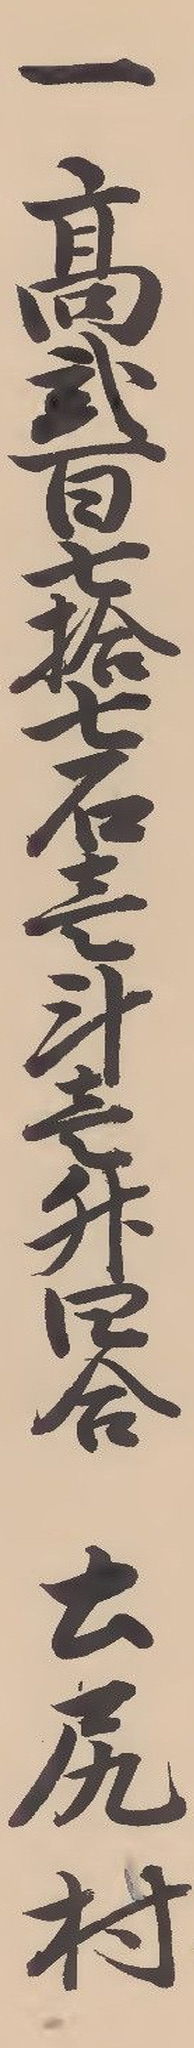一高弐百七拾七石壱斗壱升四合土尻村
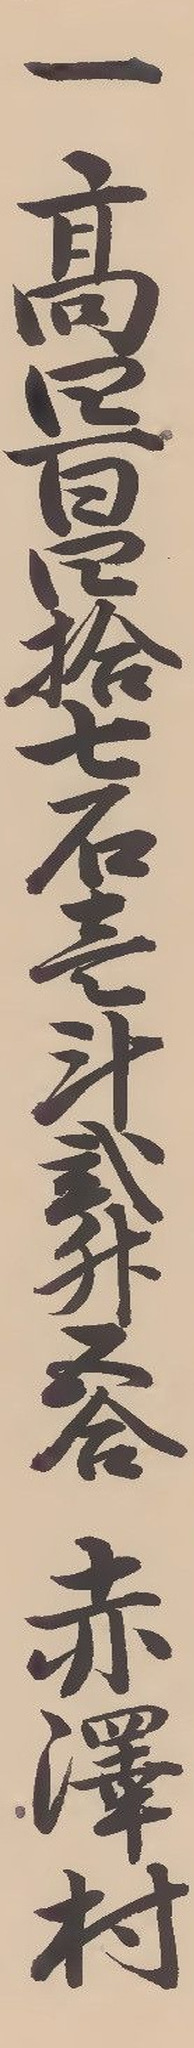一高四百四拾七石壱斗弐升五合赤沢村
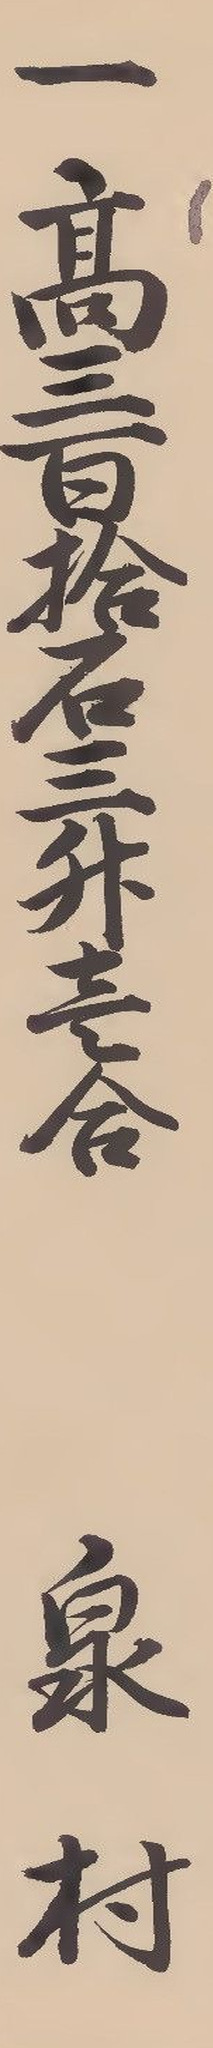一高三百拾石三升壱合泉村
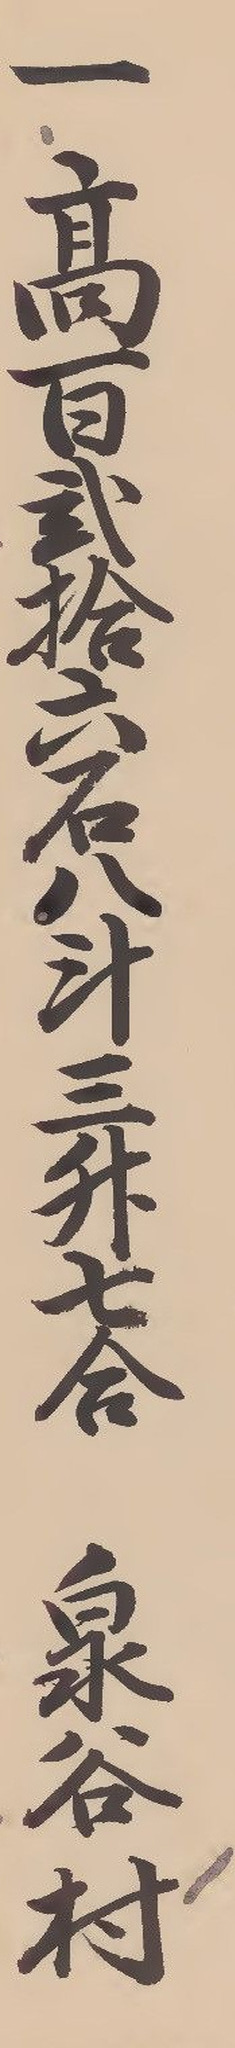一高百弐拾六石八斗三升七合泉谷村

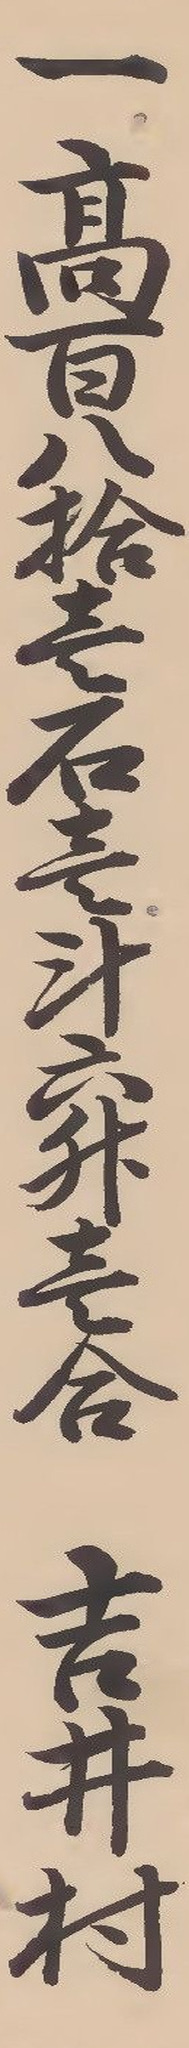一高百八拾壱石壱斗六升壱合吉井村
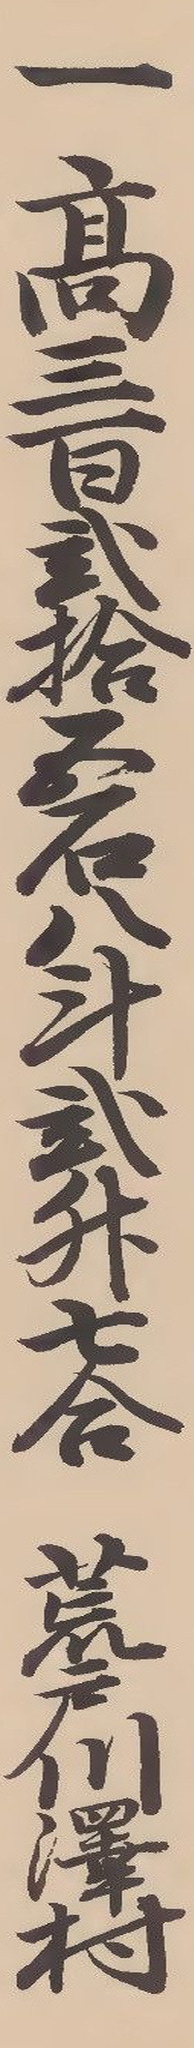一高三百弐拾五石八斗弐升七合荒戸川沢村
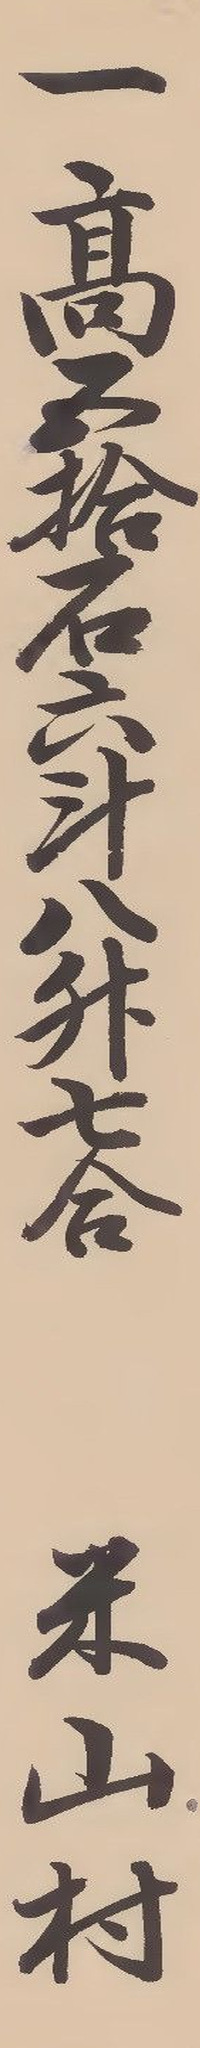一高五拾石六斗八升七合米山村
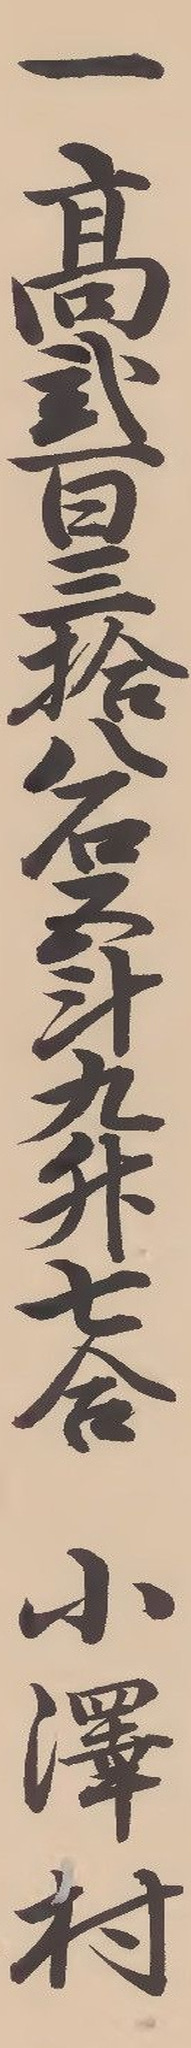一高弐百三拾八石五斗九升七合小沢村
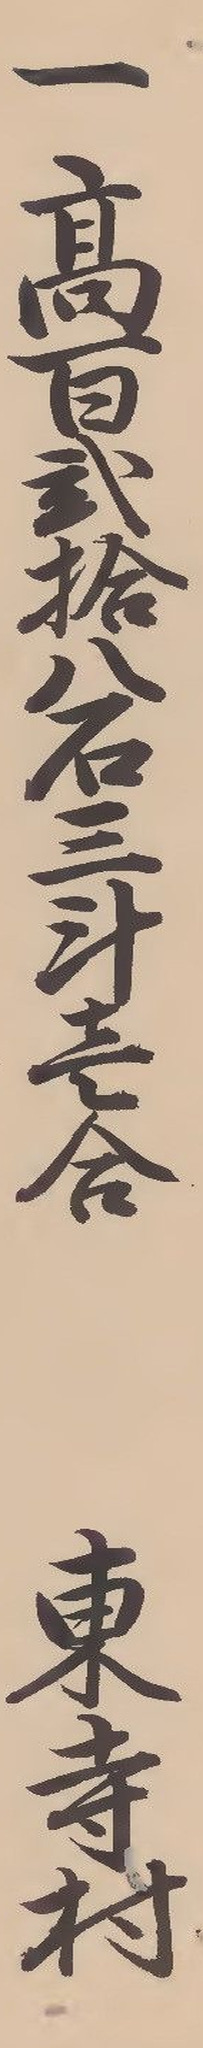一高百弐拾八石三斗壱合東寺村
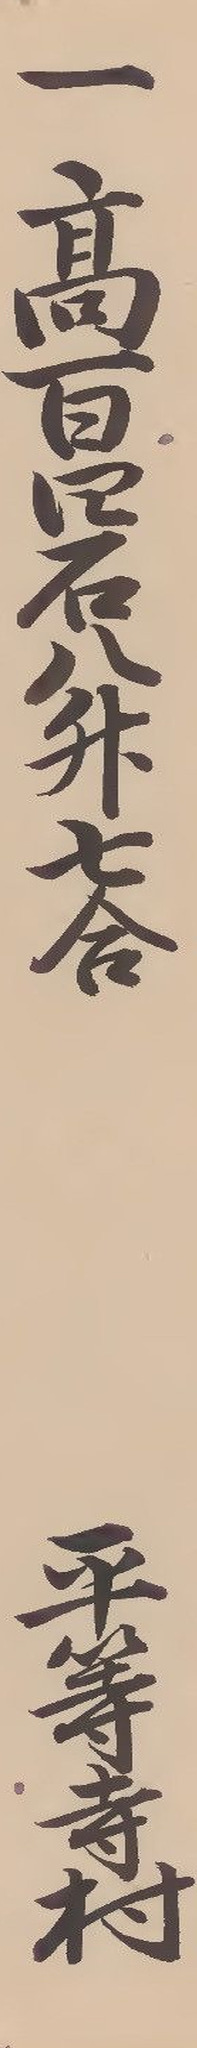一高百四石八升七合平等寺村
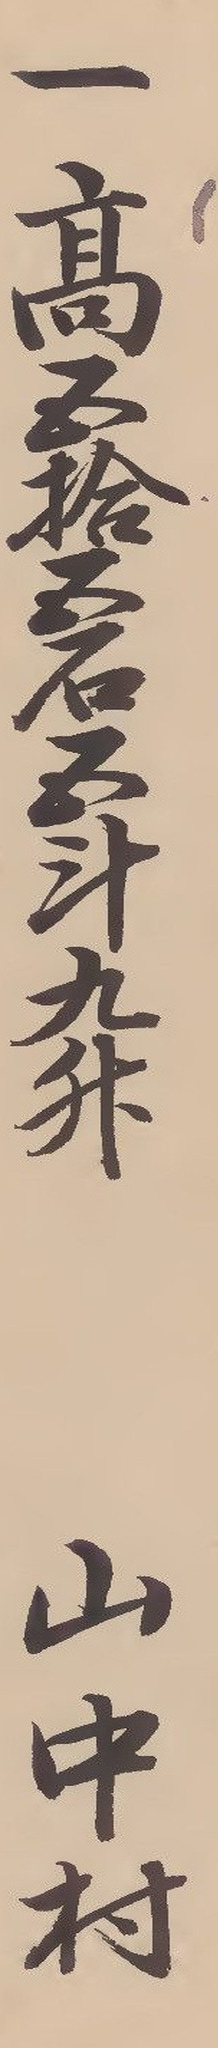一高五拾五石五斗九升山中村
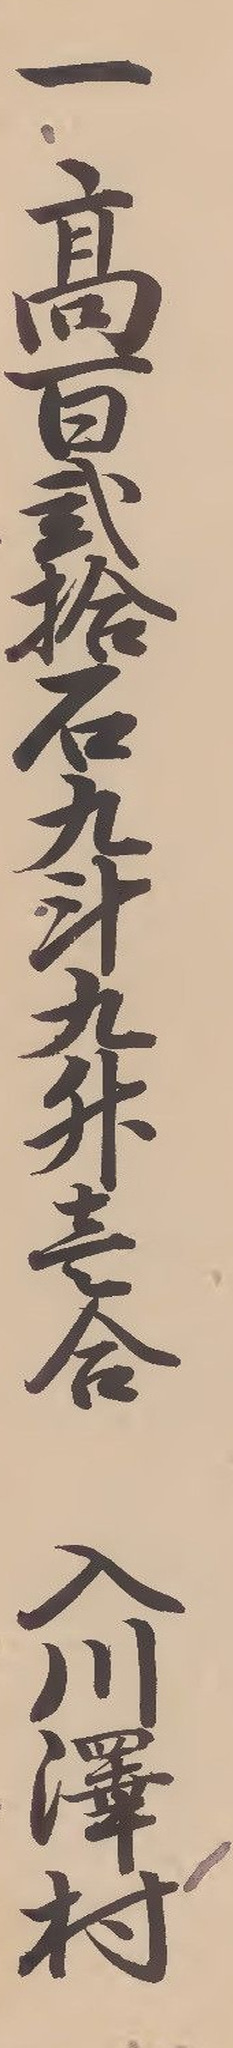一高百弐拾石九斗九升壱合入川沢村

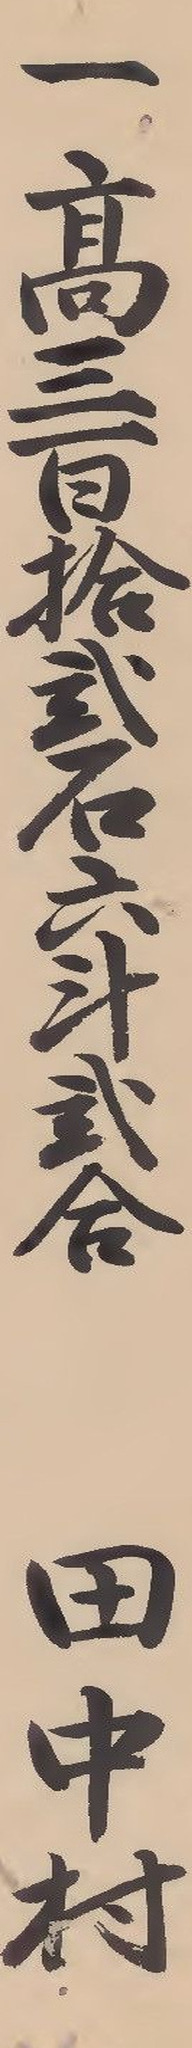一高三百拾弐石六斗弐合田中村
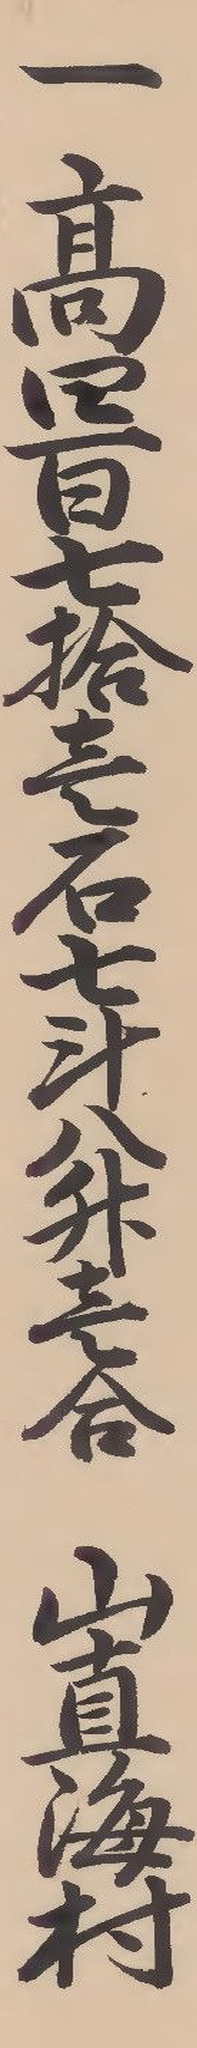一高四百七拾壱石七斗八升壱合山直海村
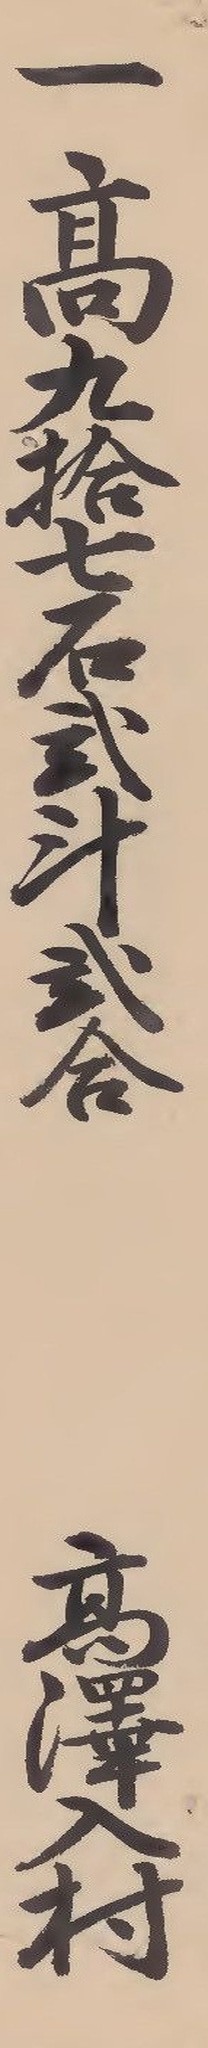一高九拾七石弐斗弐合高沢入村
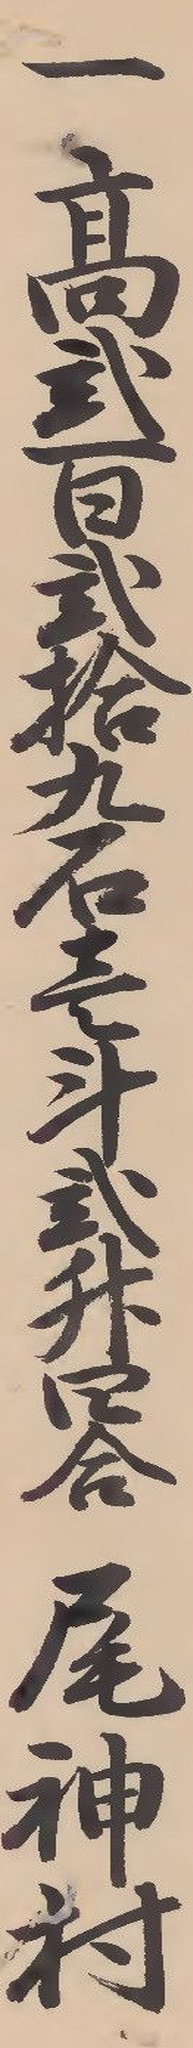一高弐百弐拾九石壱斗弐升四合尾神村
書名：越後国郷帳　上
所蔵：国立公文書館 National Archives of Japan
